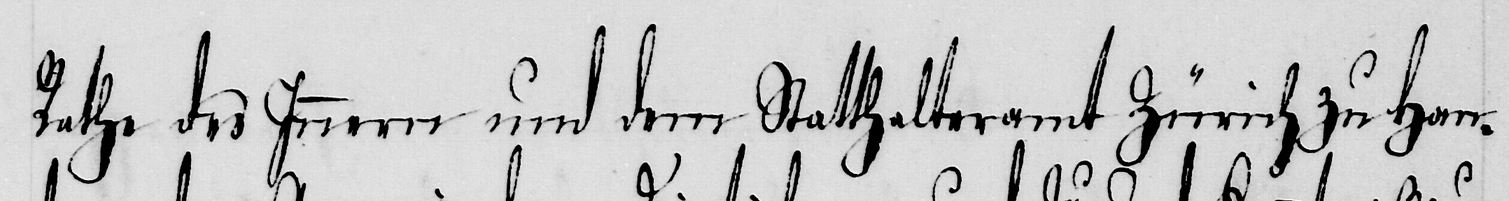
Rathe des Innern und dem Statthalteramt Zürich zu Han¬
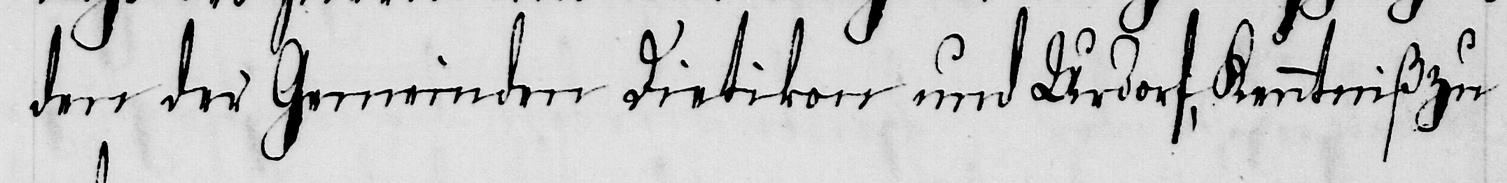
den der Gemeinden Dietikon und Urdorf, Kenntniß zu
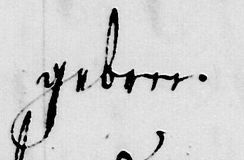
geben.
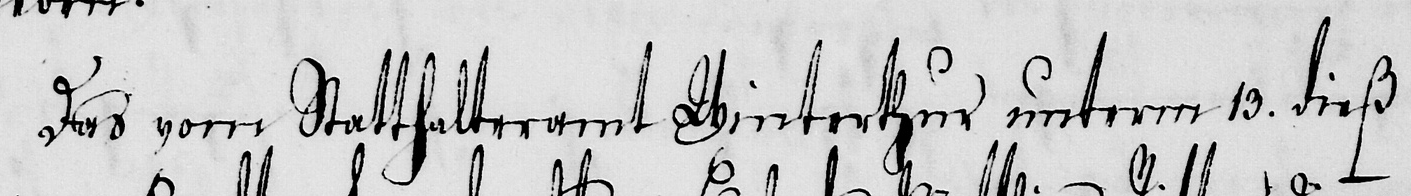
Das vom Statthalteramt Winterthur unterm 13. dieß
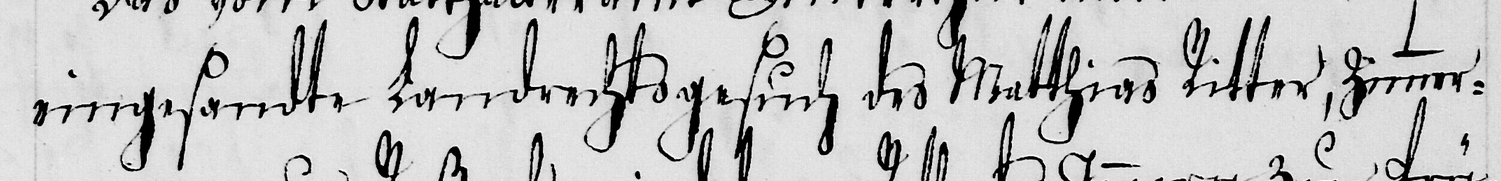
eingesandte Landrechtsgesuch des Matthias Ritter, Zimme¬
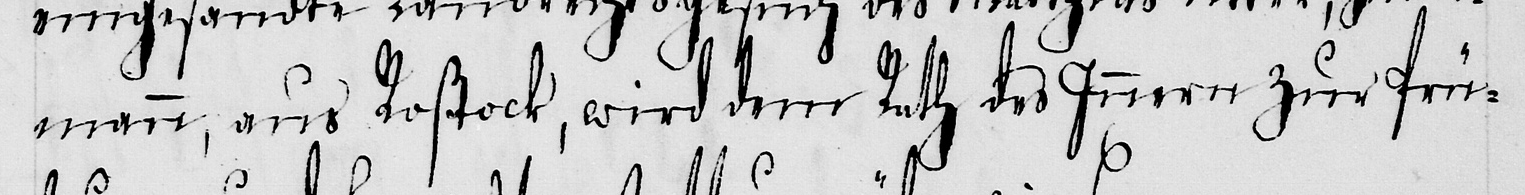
rmann, aus Rostock, wird dem Rath des Innern zur Prü¬
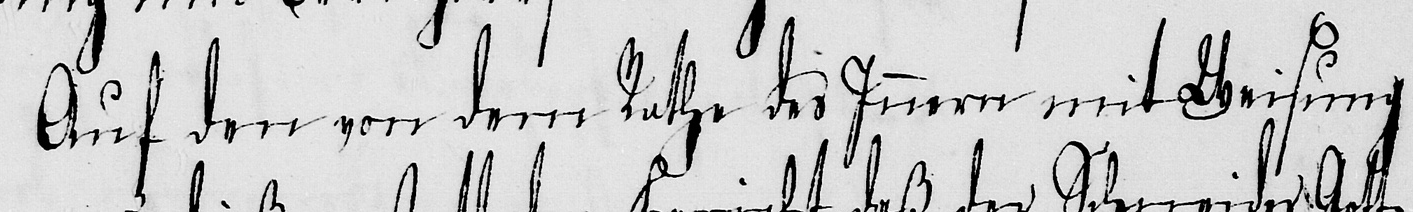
Auf den von dem Rathe des Innern mit Weisung
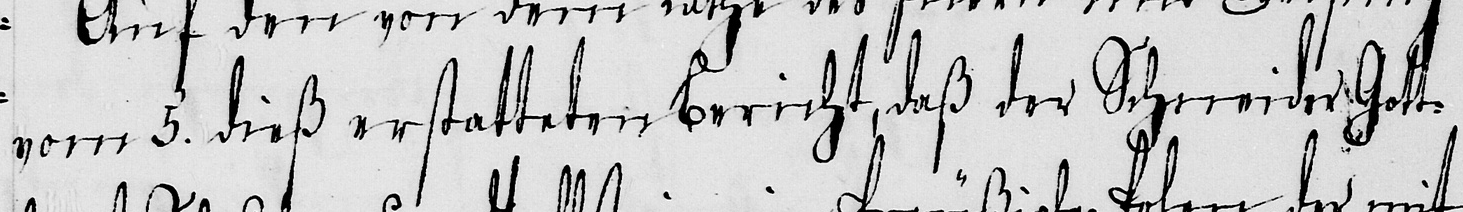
vom 5. dieß erstatteten Bericht, daß der Schneider Got¬
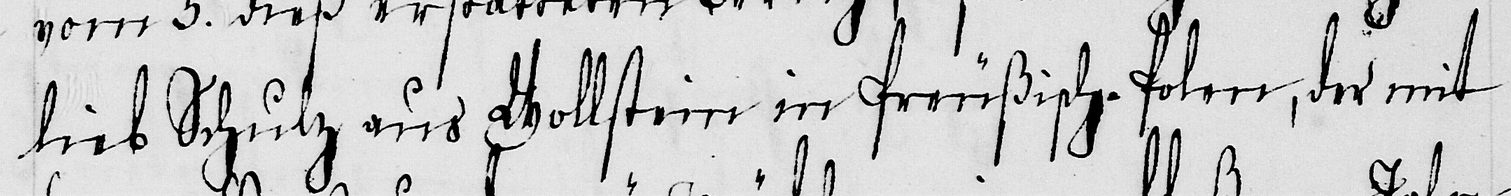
tlieb Schulz aus Wollstein in Preußisch-Polen, der mit
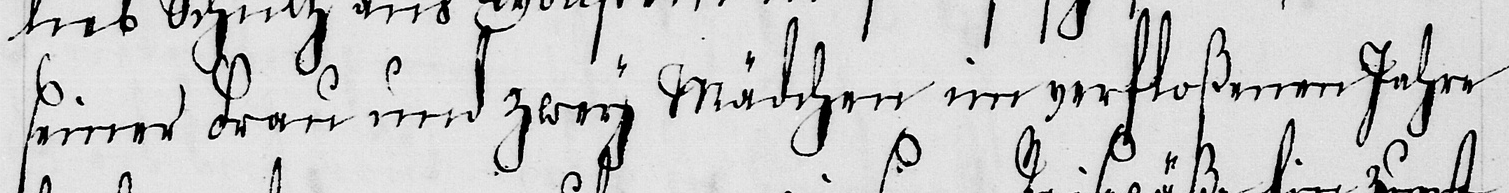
seiner Frau und zwey Mädchen im verfloßenen Jahre
